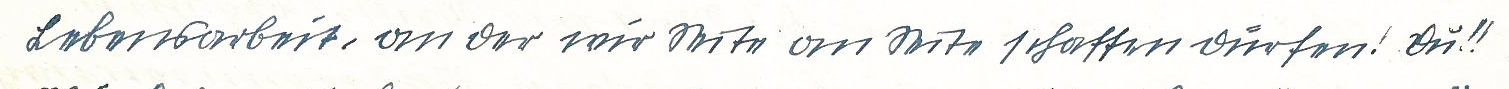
Lebensarbeit, an der wir Seite an Seite schaffen dürfen! Du!!
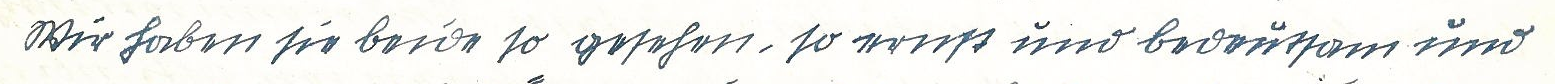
Wir haben sie beide so gesehen, so ernst und bedeutsam und
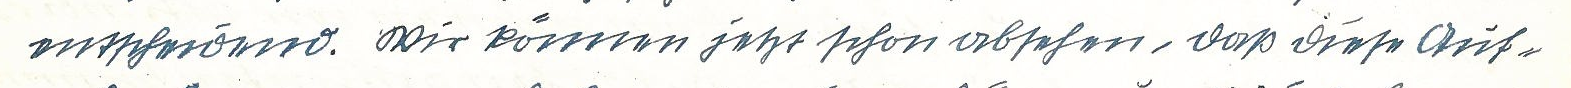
entscheidend. Wir können jetzt schon absehen, daß diese Auf¬
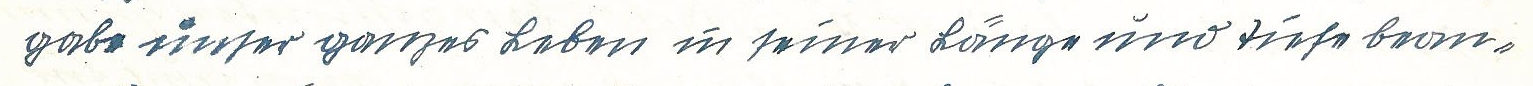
gabe unser ganzes Leben in seiner Länge und Tiefe bean¬
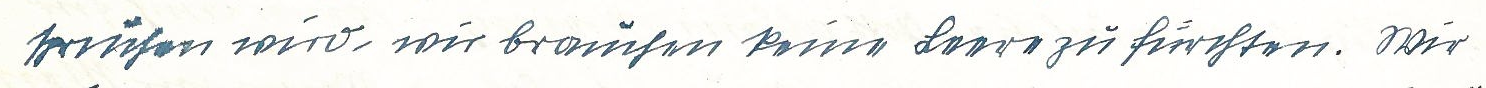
spruchen wird, wir brauchen keine Leere zu fürchten. Wir
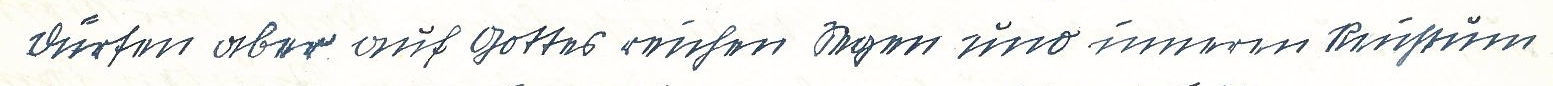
dürfen aber auf Gottes reichen Segen und inneren Reichtum
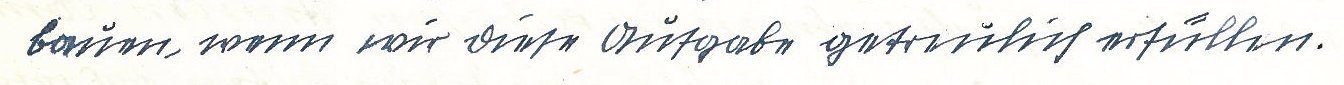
bauen, wenn wir diese Aufgabe getreulich erfüllen.
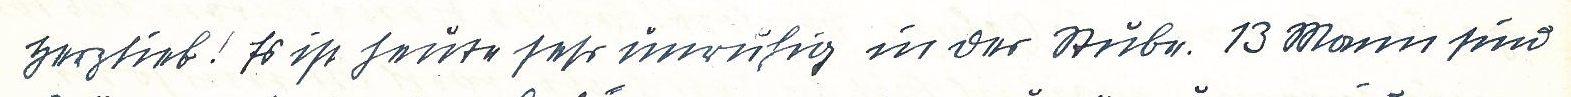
Herzlieb! Es ist heute sehr unruhig in der Stube. 13 Mann sind
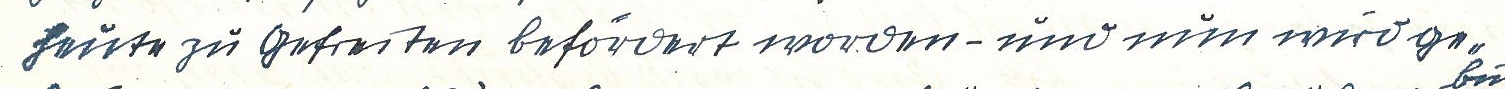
heute zu Gefreiten befördert worden – und nun wird ge¬
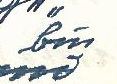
bin
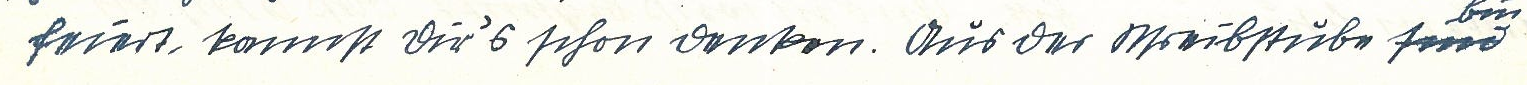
feiert, kannst dir´s schon denken. Aus der Schreibstube sind
